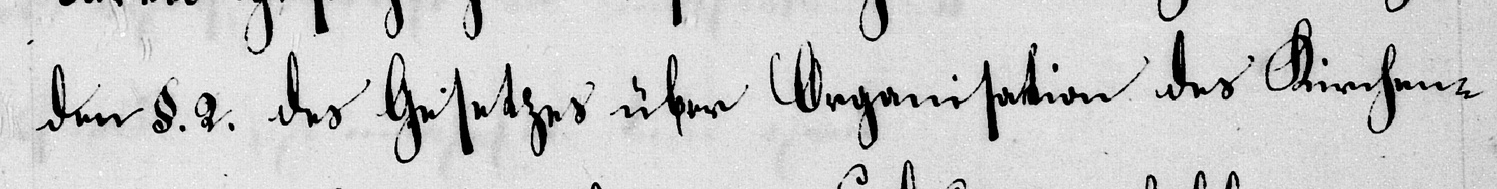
den §.2. des Gesetzes über Organisation des Kirchen¬
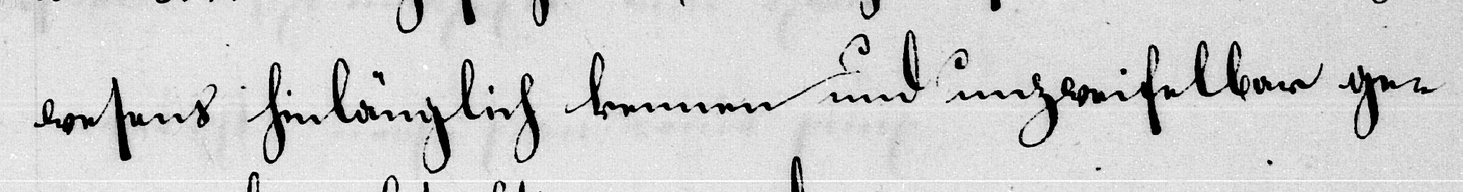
wesens hinlänglich kennen und unzweifelbar ge¬
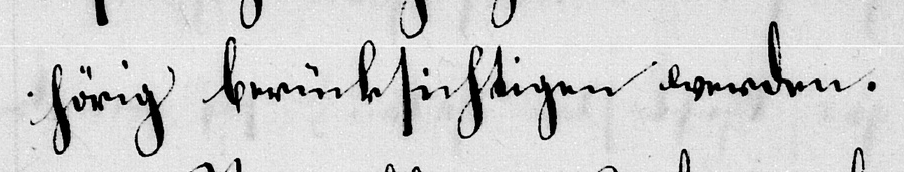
hörig berücksichtigen werden.
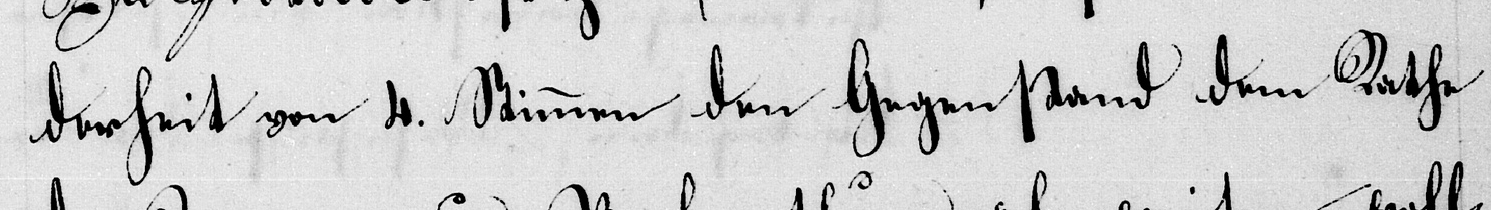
derheit von 4. Stimmen den Gegenstand dem Rathe
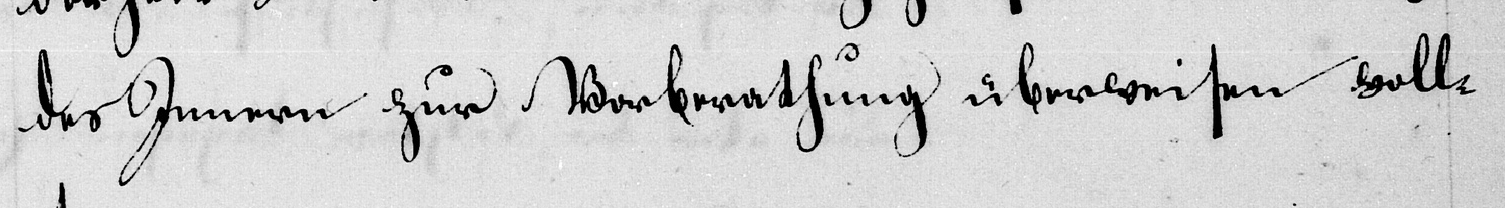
des Innern zur Vorberathung überweisen woll¬
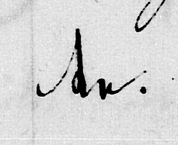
te.
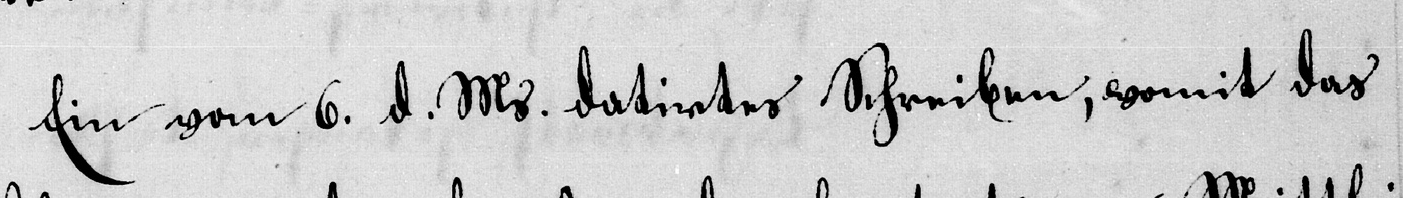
Ein vom 6. d. Ms. datirtes Schreiben, womit das
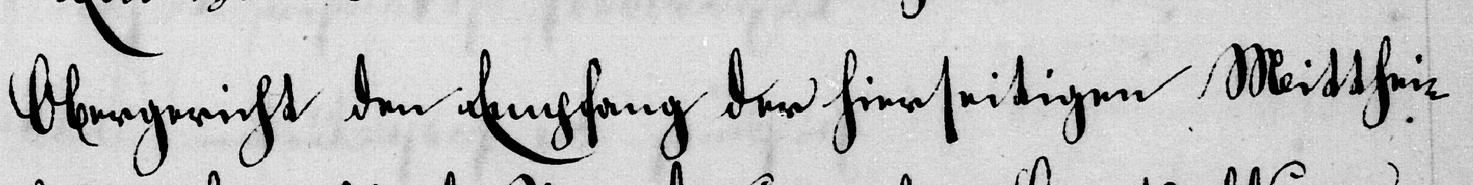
Obergericht den Empfang der hierseitigen Mitthei¬
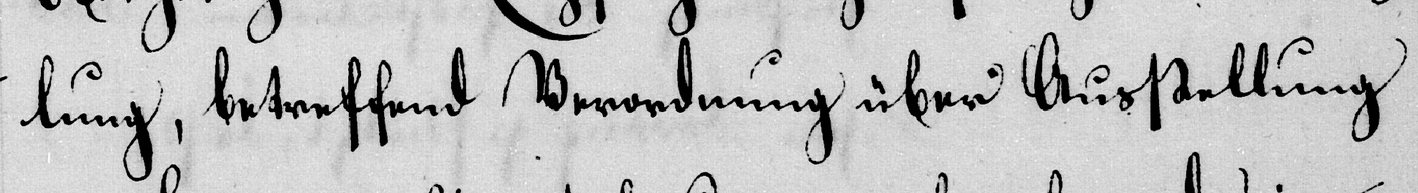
lung, betreffend Verordnung über Ausstellung
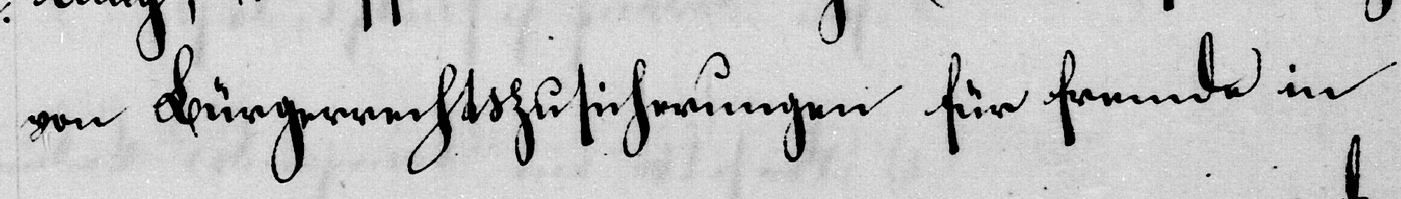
von Bürgerrechtszusicherungen für fremde in
